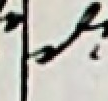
Do
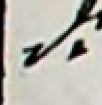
Do
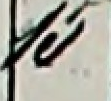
15
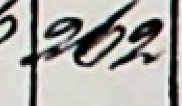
262
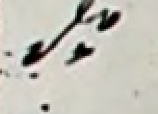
Do
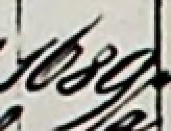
1689/a
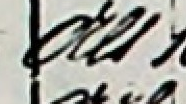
Alt
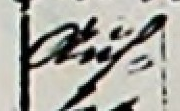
Aus„
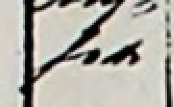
see
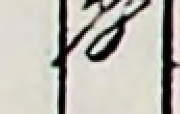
78
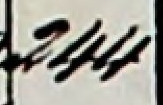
244
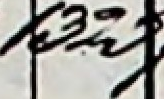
1325
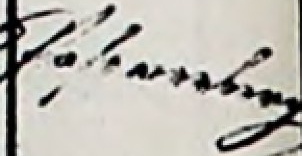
P???berg
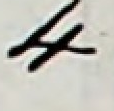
4
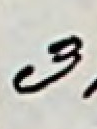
3
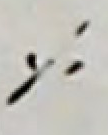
./.
